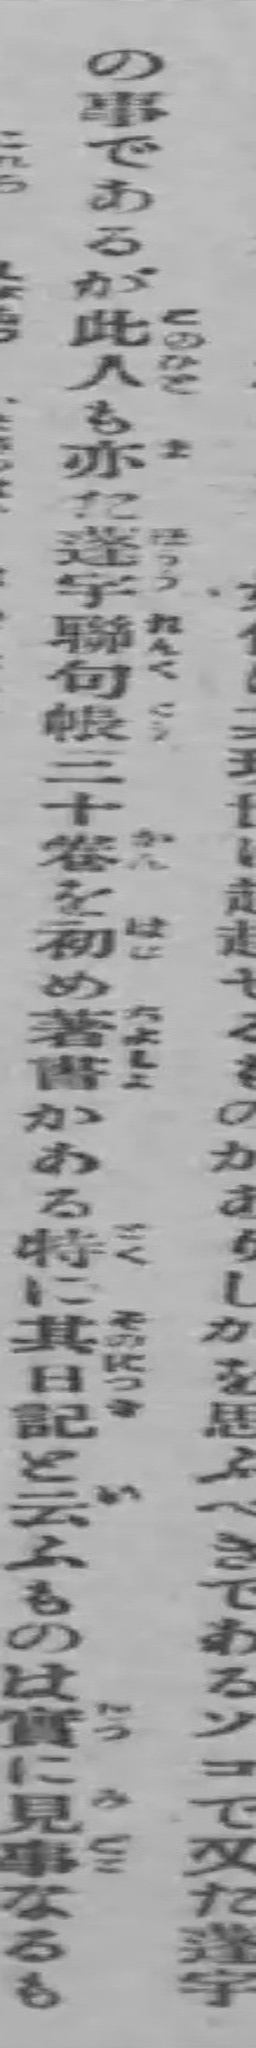蓬宇の日記の事であるが此人も亦た蓬宇連句帳三十巻を初め著書がある特に其日記と云ふものは実に見事なるも
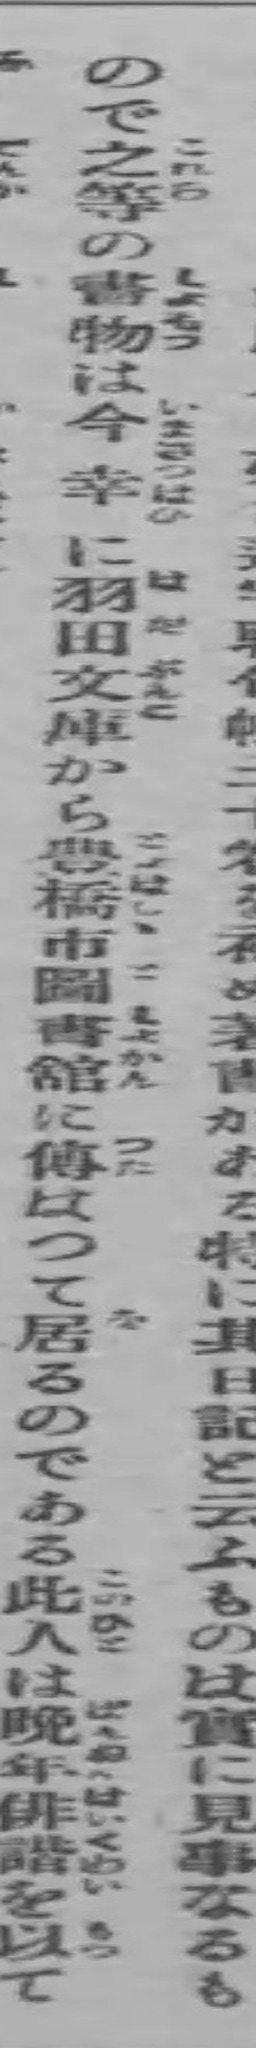ので之等の書物は今幸に羽田文庫から豊橋市図書館に伝はつて居るのである此人は晩年俳諧を以て
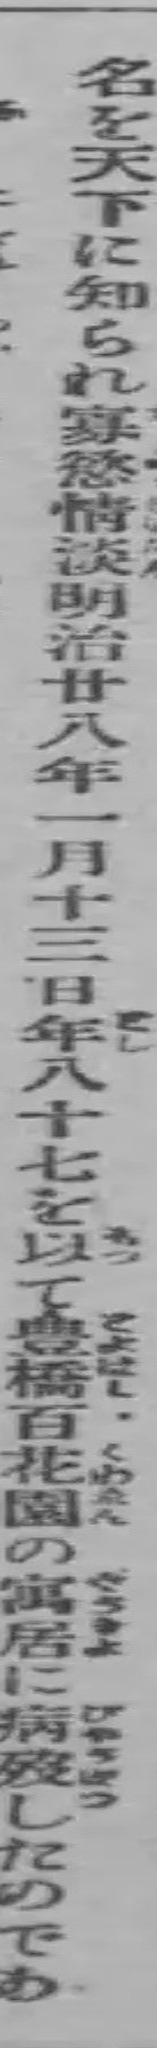名を天下に知られ寡慾清淡明治廿八年一月十三日年八十七を以て豊橋百花園の寓居に病歿したのであ
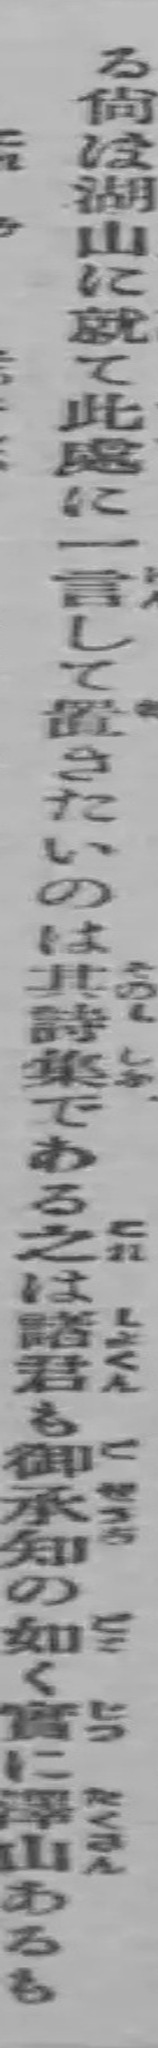る尚ほ湖山に就て此処に一言して置きたいのは其詩集である之は諸君も御承知の如く実に沢山あるも
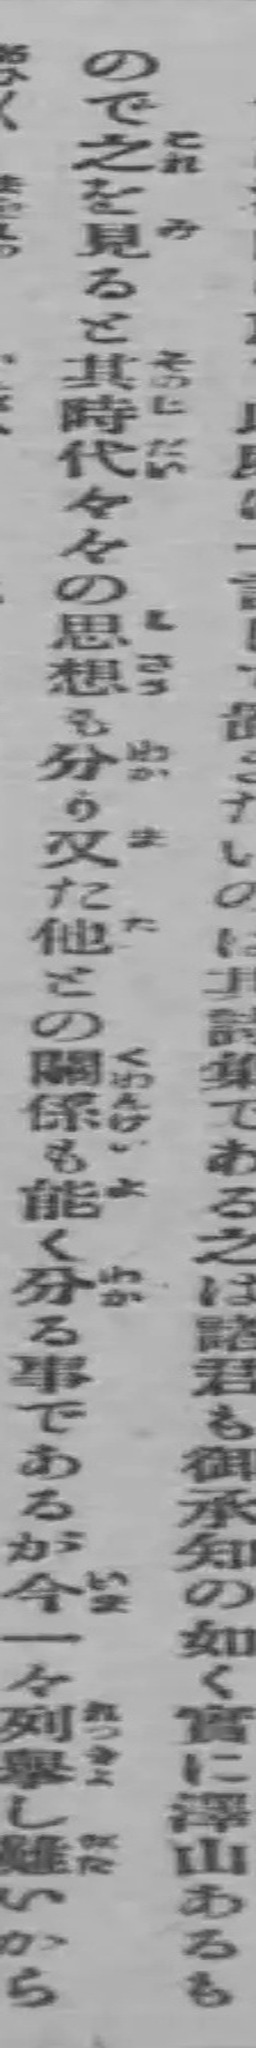ので之を見ると其時代々々の思想も分り又た他との関係も能く分る事であるが今一々列挙し難いから
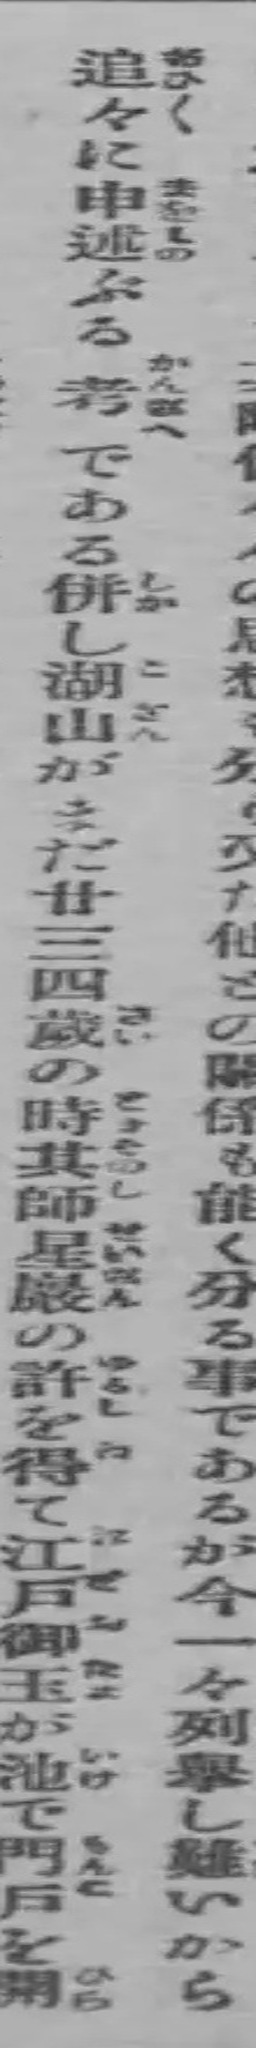追々申述ぶる考である併し湖山がまだ廿三四歳の時其師星厳の許を得て江戸御玉が池で門戸を開
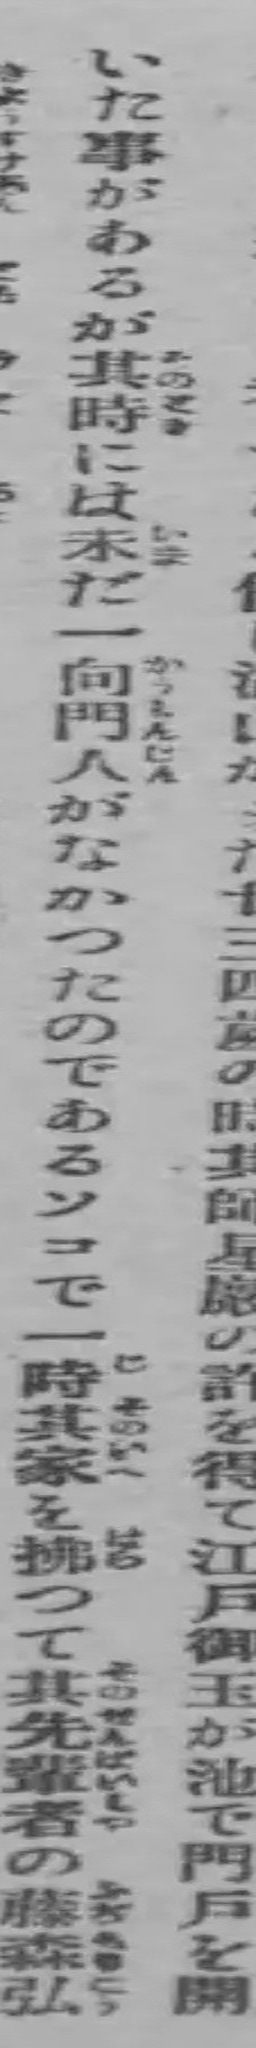いた事があるが其時には未だ一向門人がなかつたのであるソコで一時其家を払つて其先輩者の藤森弘
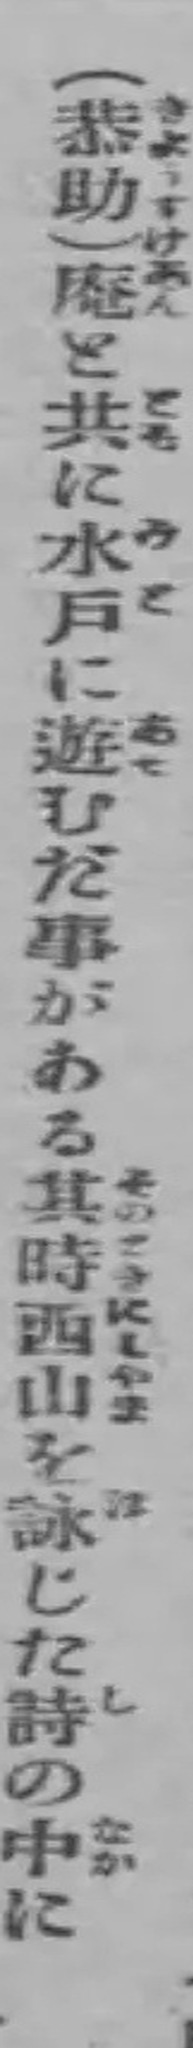(恭助)庵と共に水戸に遊むだ事がある其時西山を詠じた詩の中に
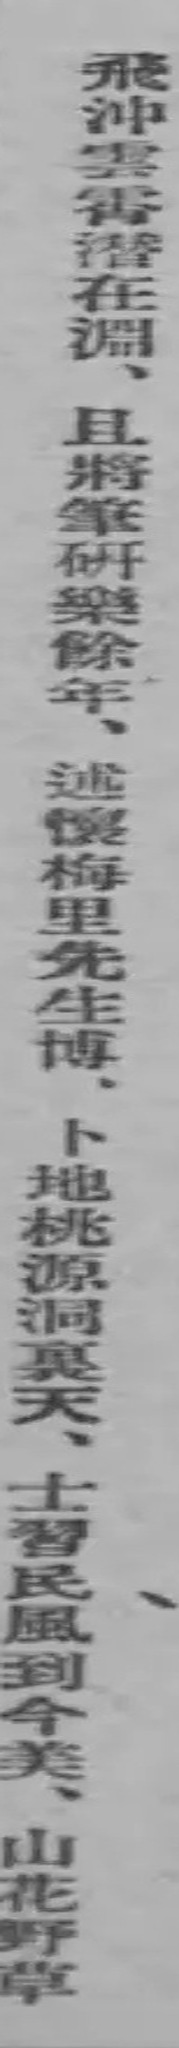飛沖雲霄潜在淵、且将筆研楽余年、述懐梅里先生博、卜地桃源洞裏天、士習民風到今美、山花野草
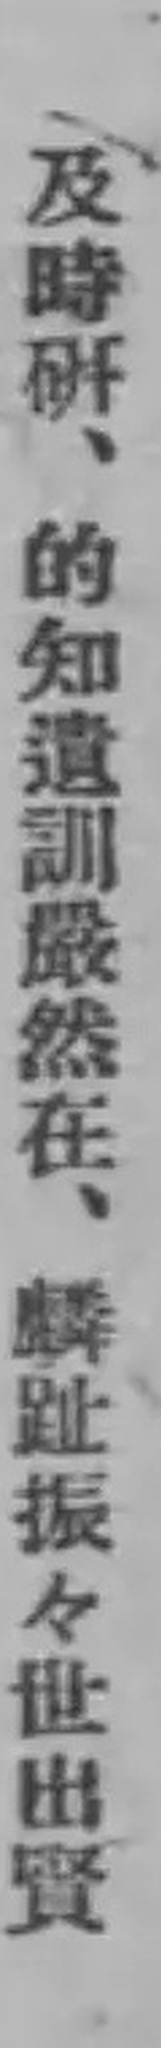及時研、的知遺訓厳然在、麟趾振々世出賢
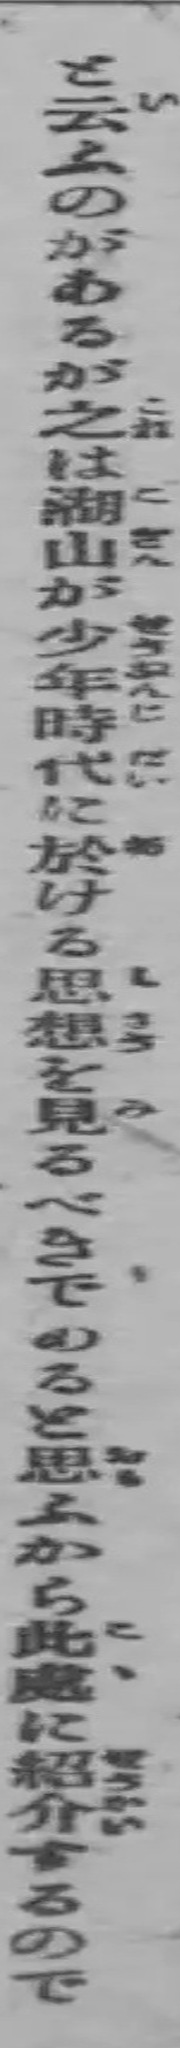と云ふのがあるが之は湖山が少年時代に於ける思想を見るべきであると思ふから此処に紹介するので
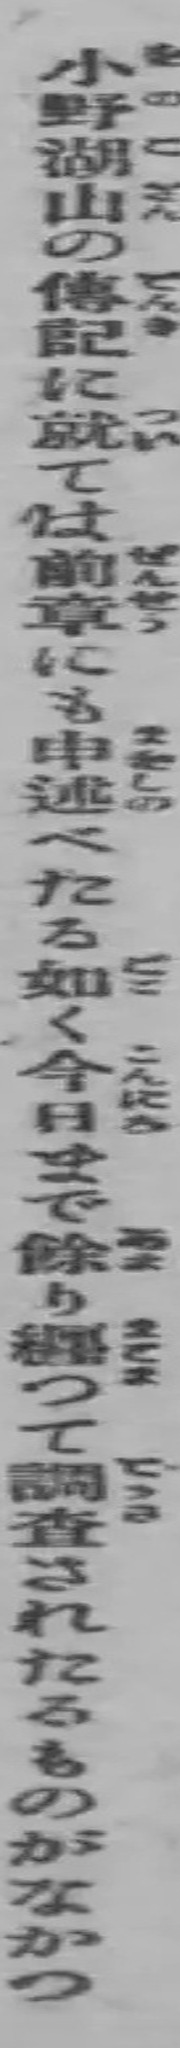小野湖山の伝記に就ては前章にも申述べたる如く今日まで余り纏つて調査されたるものがなかつ
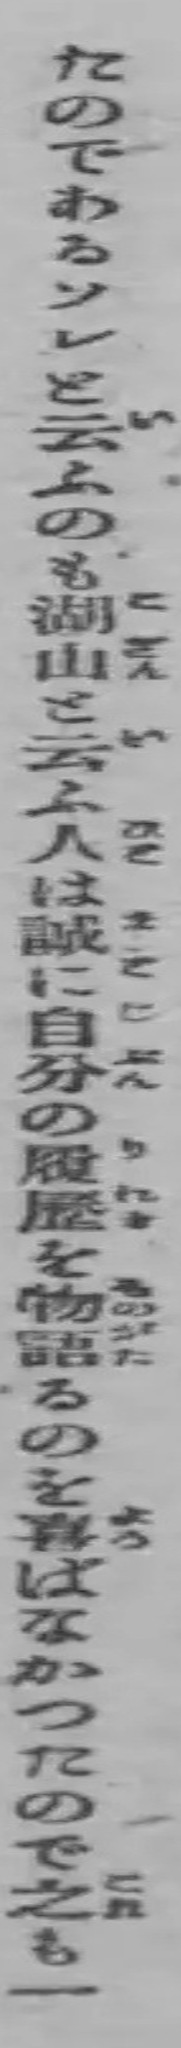たのであるソレと云ふのも湖山と云ふ人は誠に自分の履歴を物語るのを喜ばなかつたので之も一
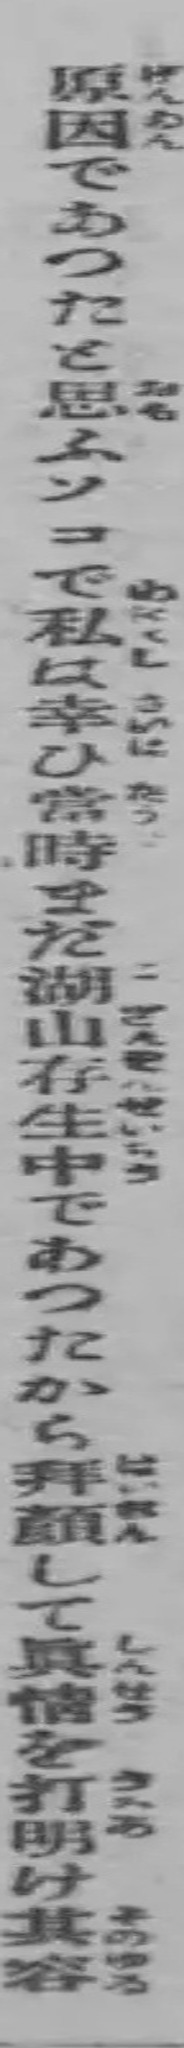原因であつたと思ふソコで私は幸に当時まだ湖山在生中であつたから拝顔して真情を打明け其容
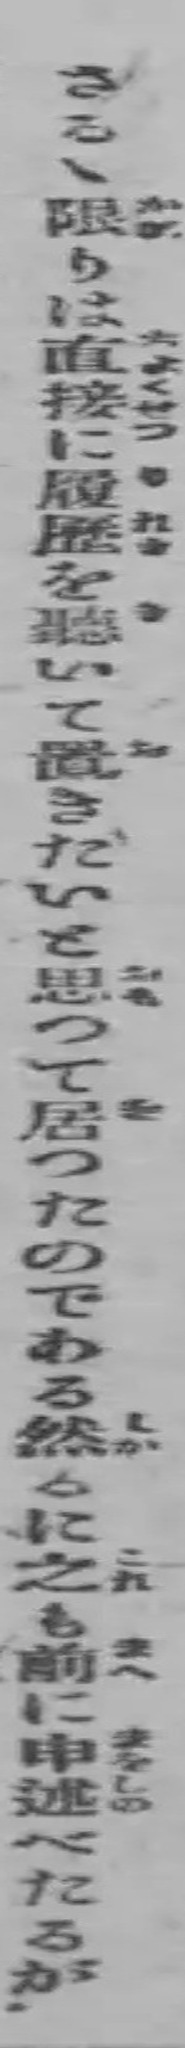さるゝ限りは直接に履歴を聴いて置きたいと思つて居つたのである然るに之も前にも申述べたるが
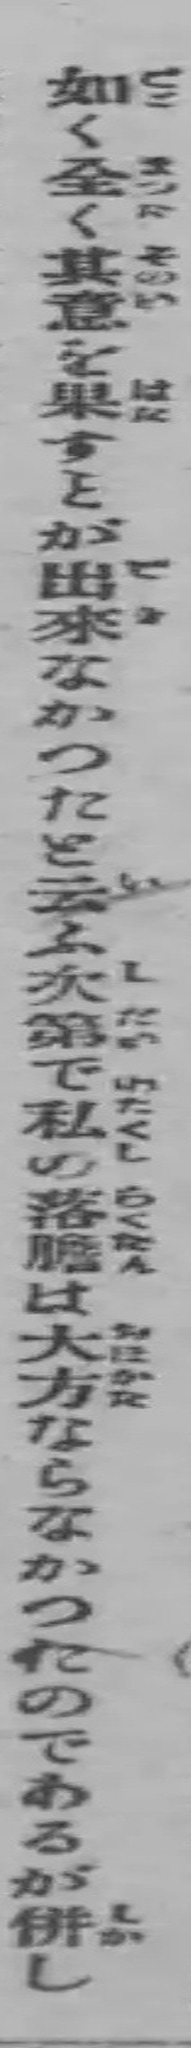如く全く其意を果すことが出来なかつたと云ふ次第で私の落胆は大方ならなかつたのであるが併し
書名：豊橋市史談
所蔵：国立国会図書館 National Diet Library, JAPAN
